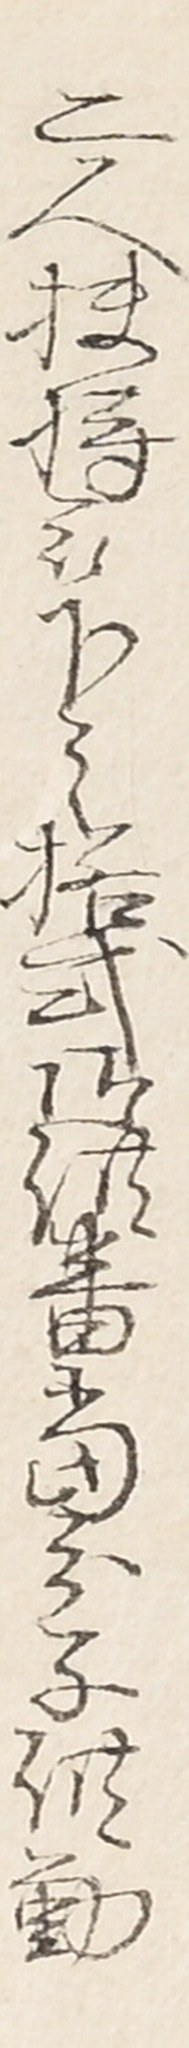二人扶持被下之格式御供番当分子供勤
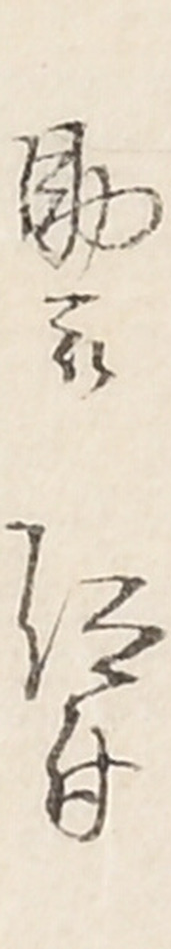助被仰付
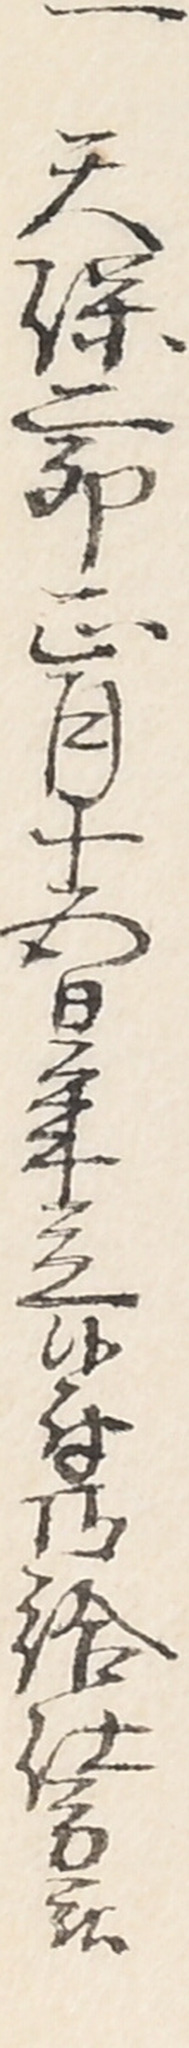一天保二卯正月十五日年立候付御給仕方被
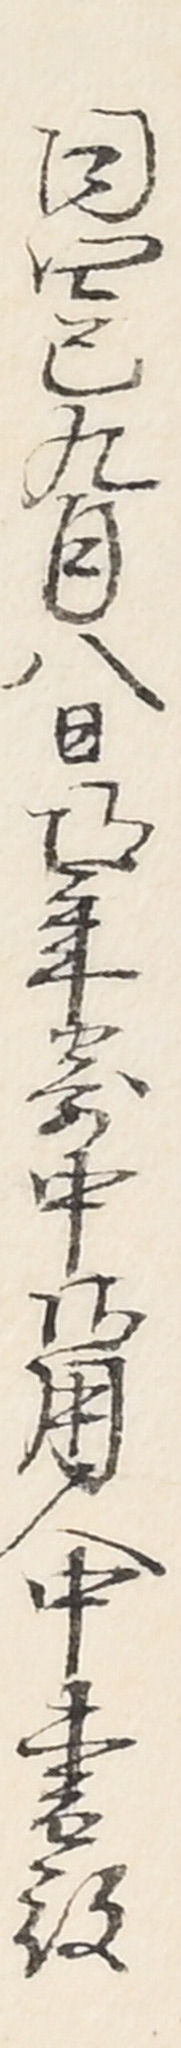一同四巳九月八日御年寄中御用人中書役
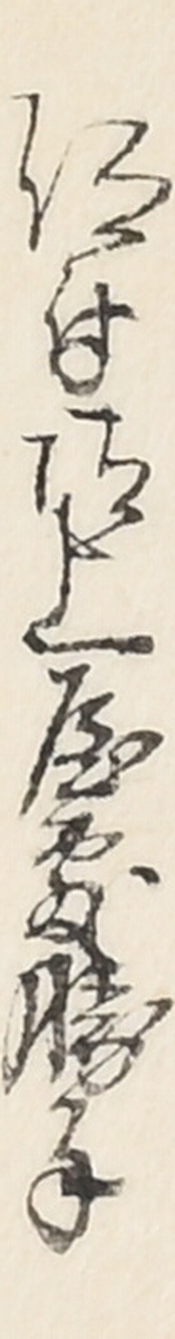被仰付御上屋敷勝手
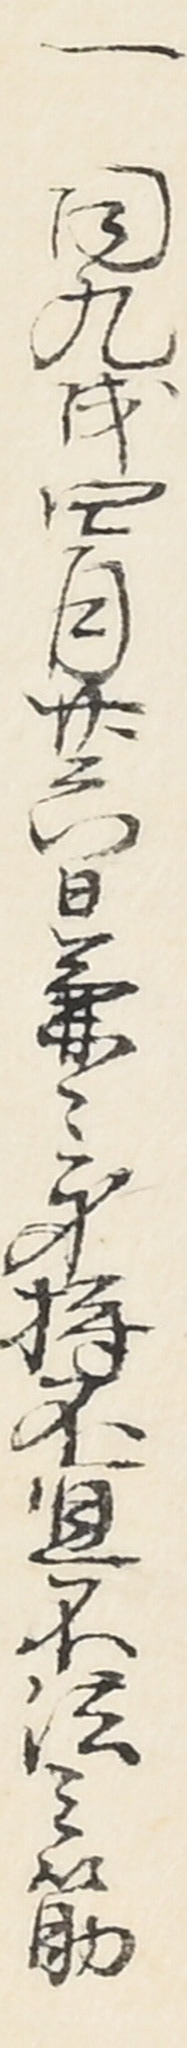一同九戌四月廿六日兼々身持不宜不法之筋
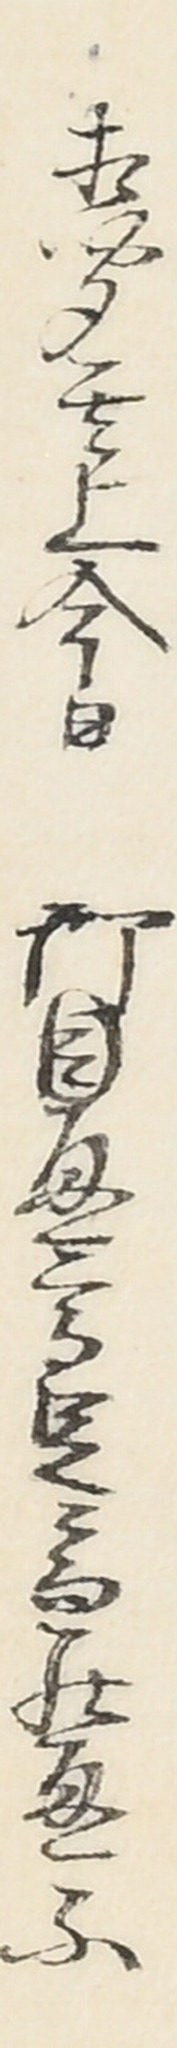相聞其上今日御目通高足ニ而罷通不
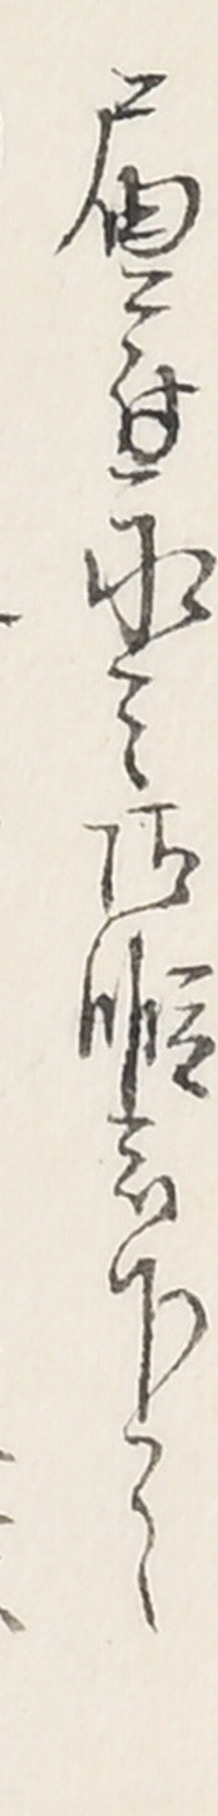届ニ付永之御暇被下之
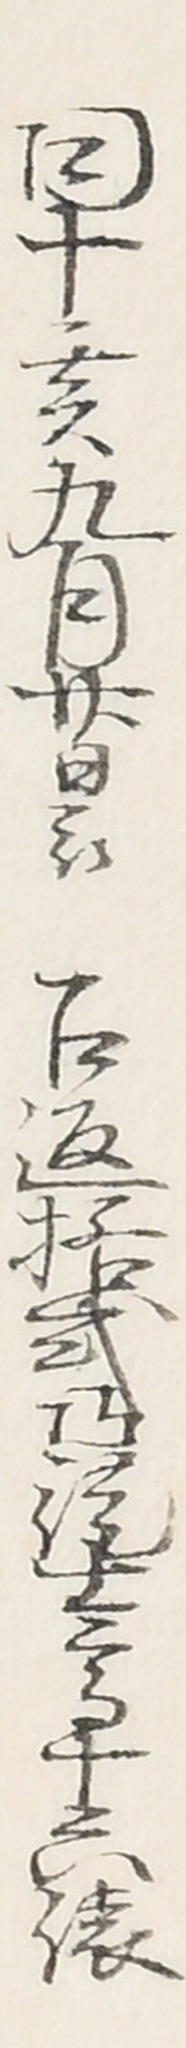一同十亥九月廿日被召返格式御徒士高十六俵
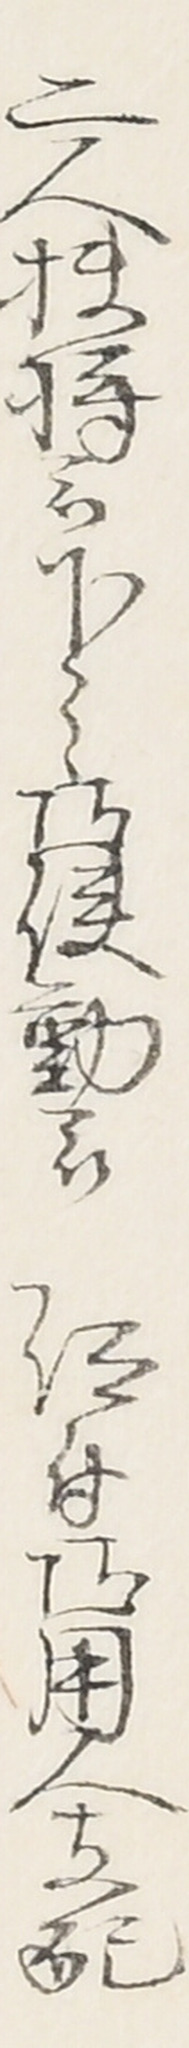二人扶持被下之御使勤被仰付御用人支配
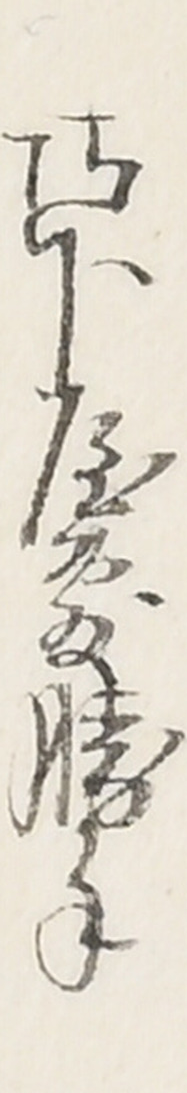御下屋敷勝手
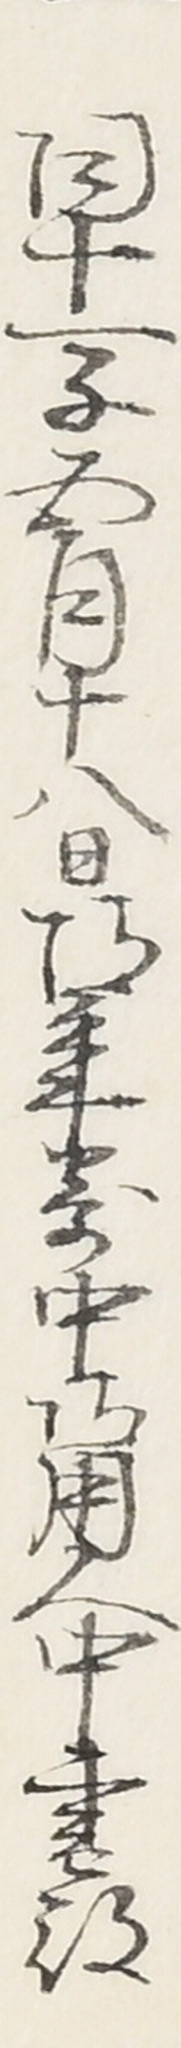一同十一子五月十八日御年寄中御用人中書役
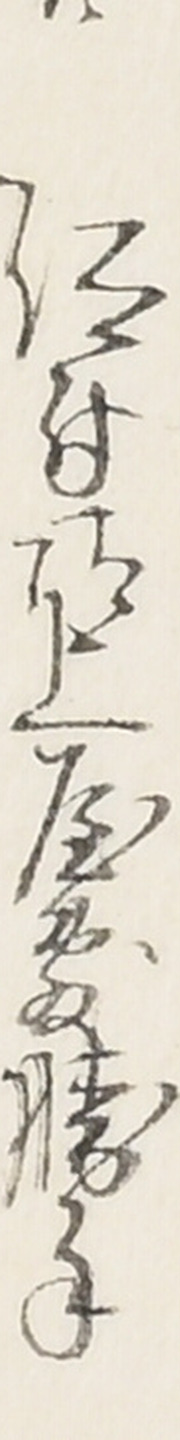被仰付御上屋敷勝手
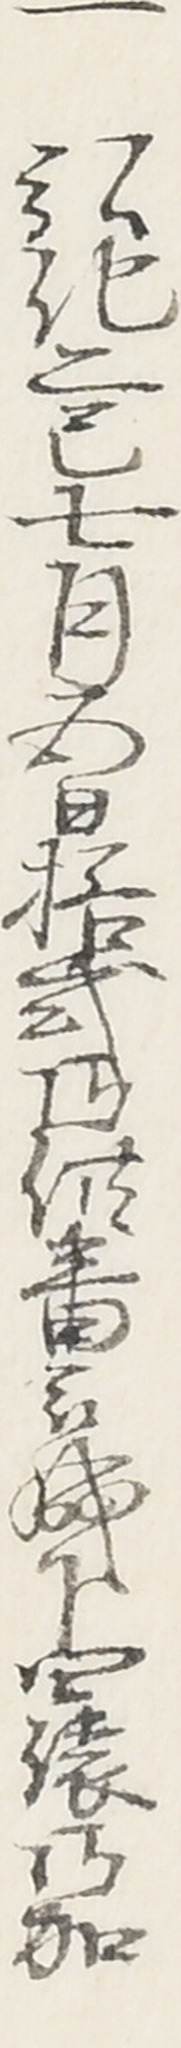一弘化二巳七月五日格式御供番被成下四俵御加
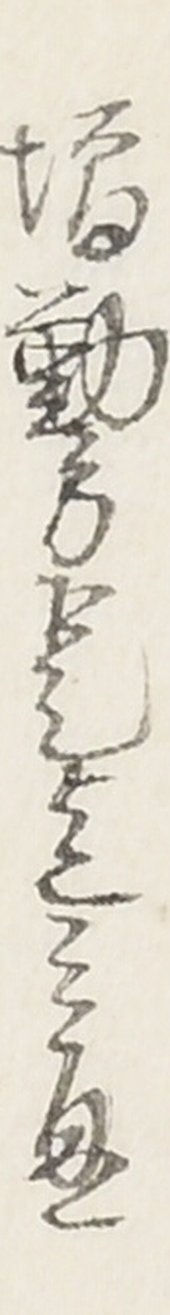増勤方是迄之通
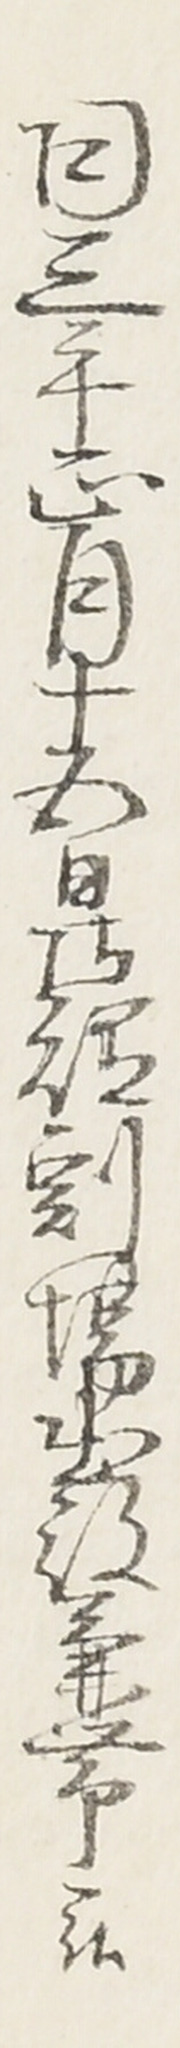一同三午正月十五日御賄割場出役兼帯被
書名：無足諸士勤仕録（四）
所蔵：伊那市立高遠町図書館・合同会社AMANE
